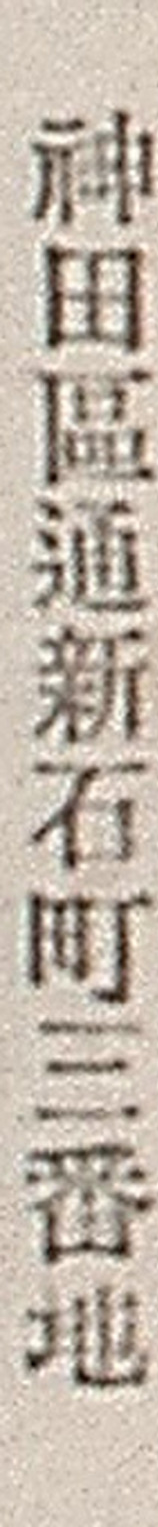神田區通新石町三番地

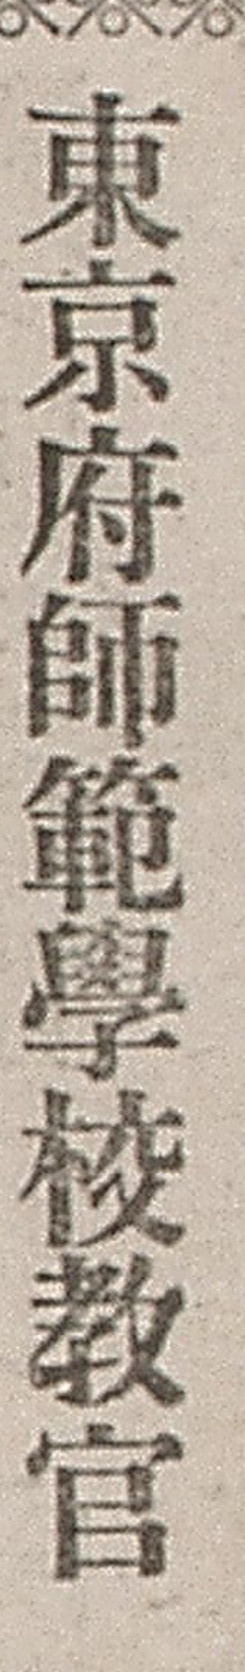東京府師範学校教官
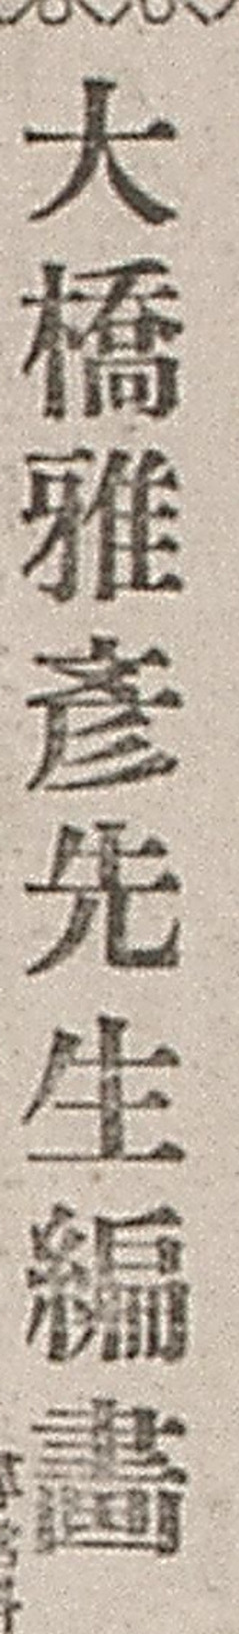大橋雅彦先生編畫
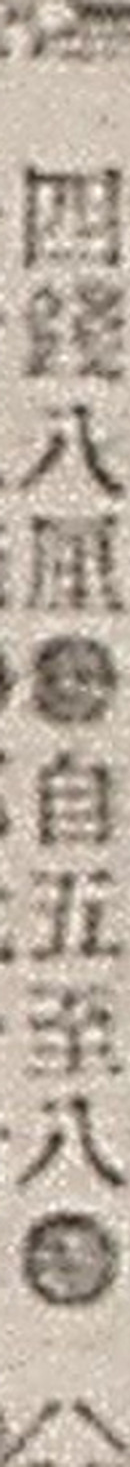四銭八厘●自五至八●
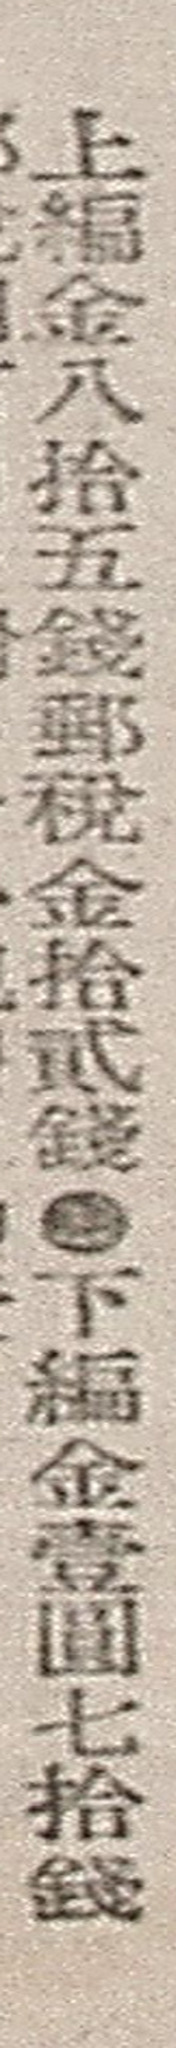上編金八拾五銭郵税金拾弐銭●下編金壱圓七拾銭
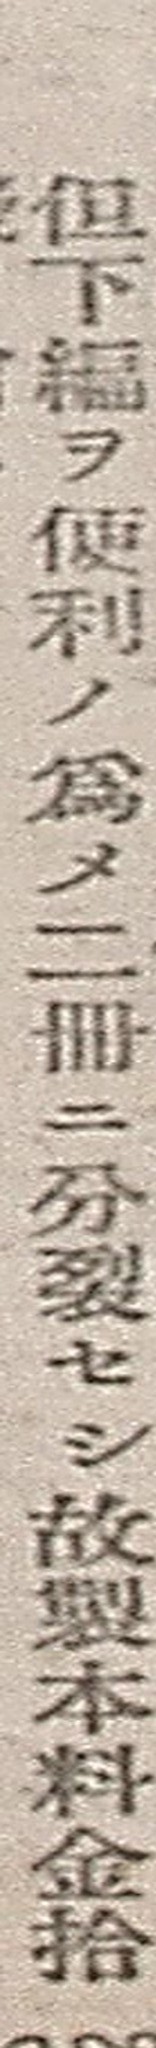但下編ヲ便利ノ為メ二冊二分裂セシ故製本料金拾
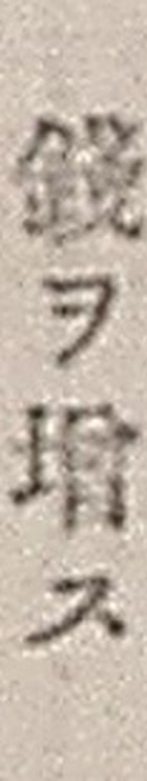銭ヲ増ス
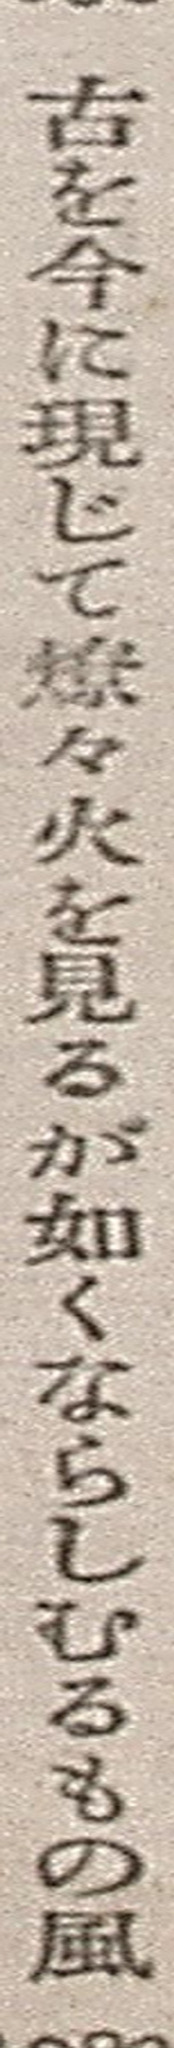右を今に現じて燎々火を見るが如くならしむるもの風
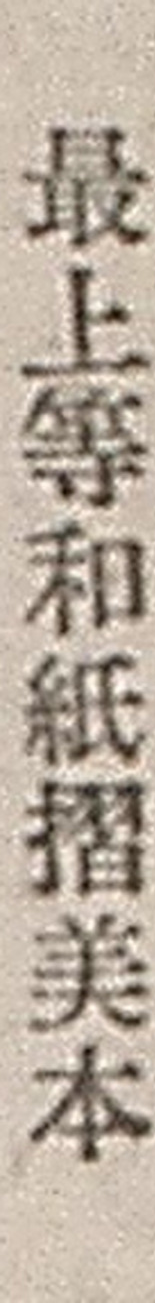最上等和紙摺美本
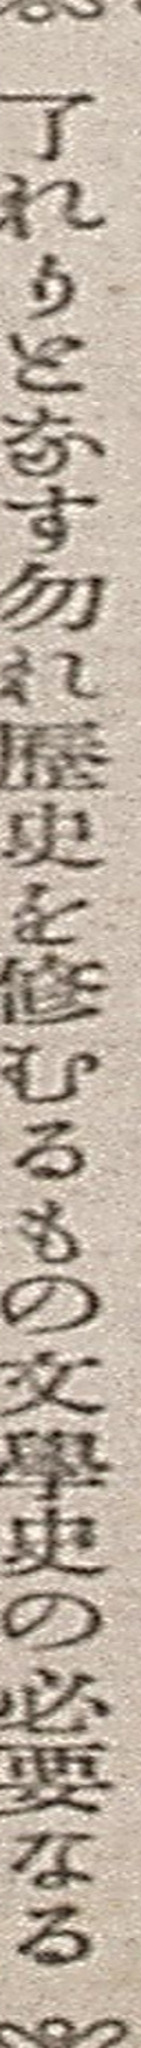了れりとなそ勿れ歴史を修むるもの文学史の必要なる
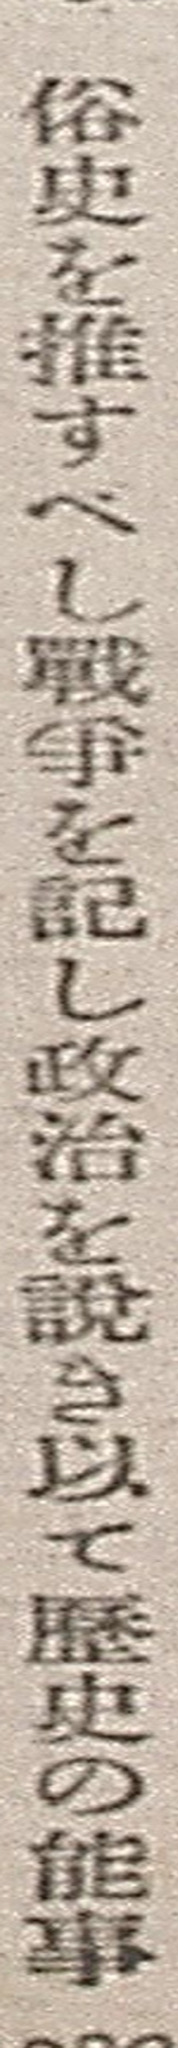俗史を推すべし戦争を記し政治を説き以て歴史の能事
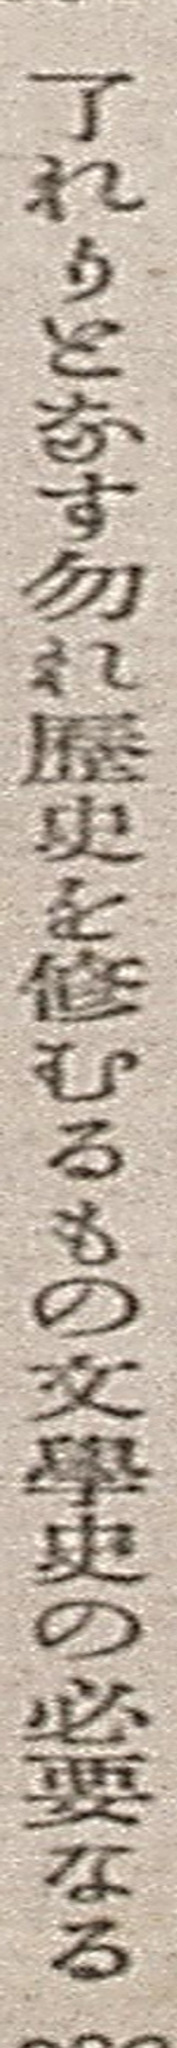了れりとなそ勿れ歴史を修むるもの文学史の必要なる
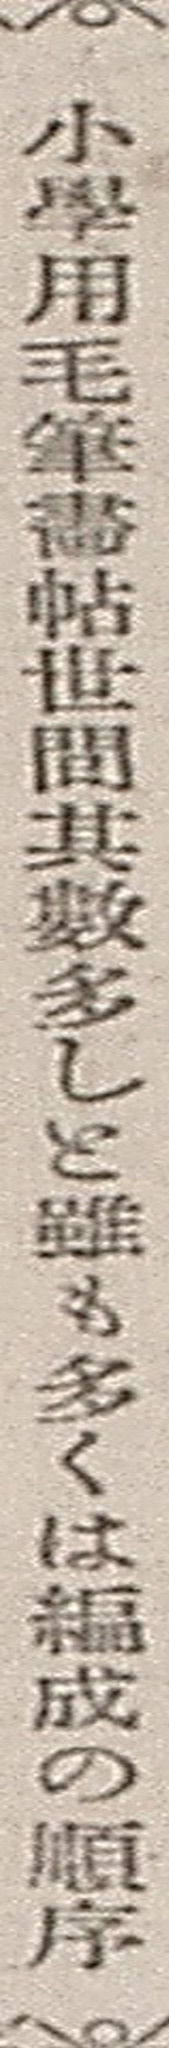小学用毛筆畫帖世間其数多しい雖も多くは編成の順序
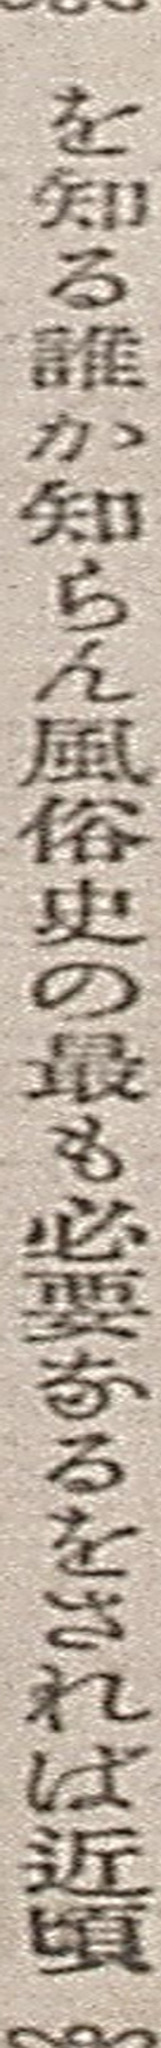を知る誰か知らん風俗史の最も必要なるをされば近頃
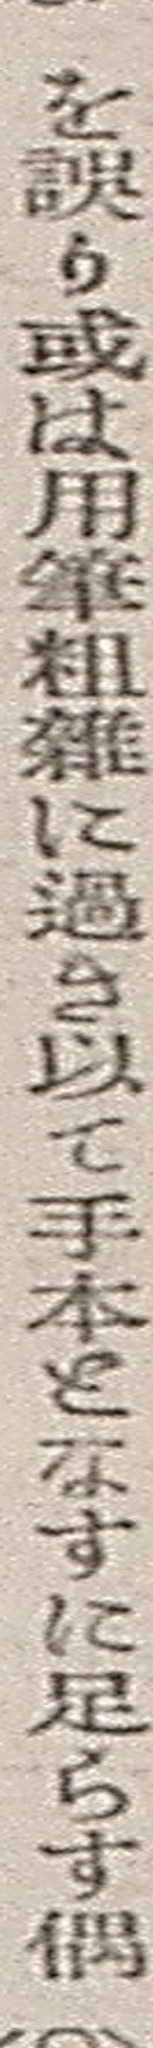を誤り或は用筆粗雑に過き以て手本となすに足らす偶
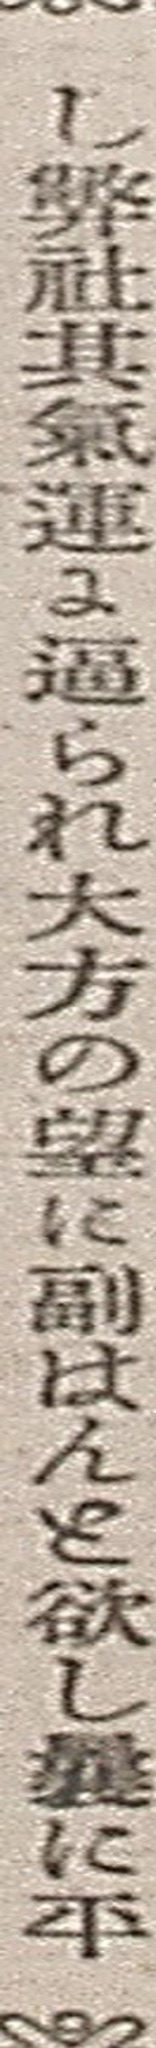し弊社其気運に逼られ大方の望に副はんと欲し曩に平
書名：風俗畫報臨時増刊第百二十六號　洪水被害録（中）
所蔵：東京大学地震研究所図書室 Earthquake Research Institute Library, The University of Tokyo, JAPAN
